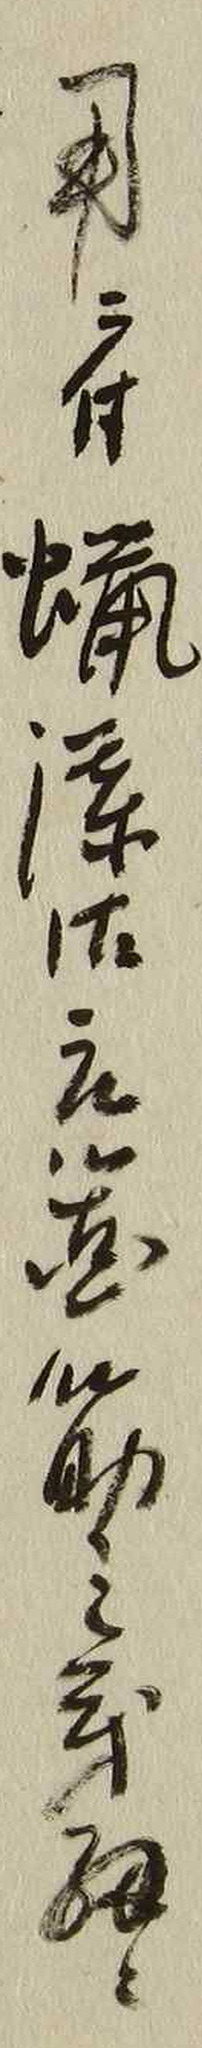用ニ付蝋漆御取箇筋之義細々
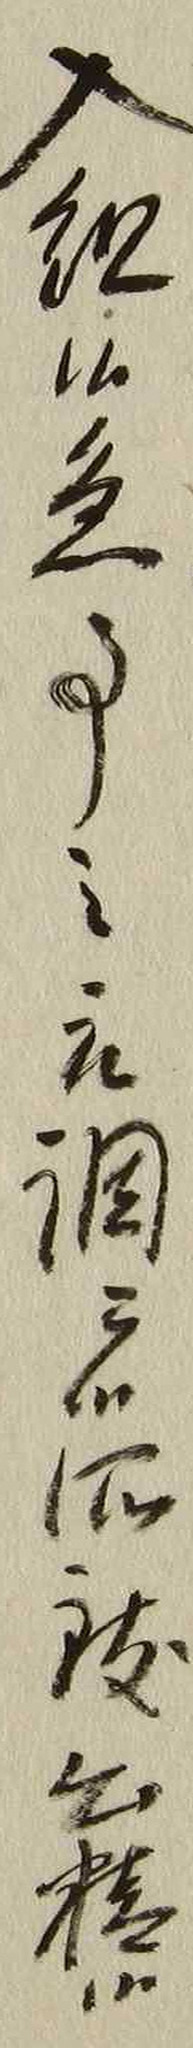入組候急事之取調ニ候所致出精候
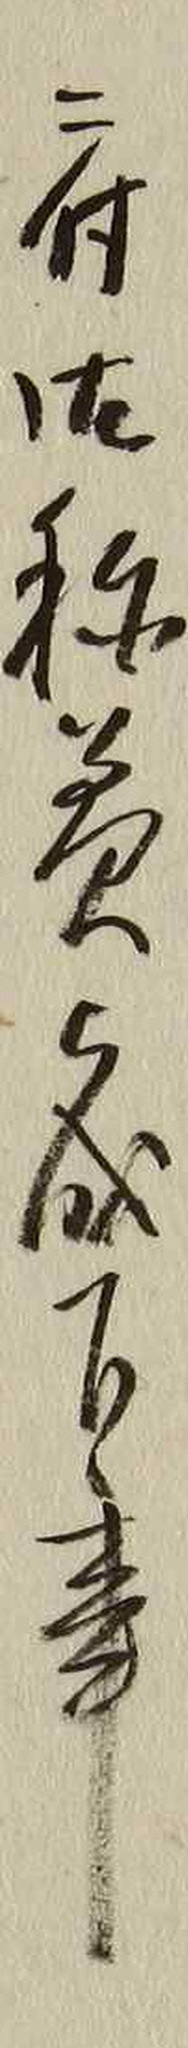ニ付御称美被成下候事
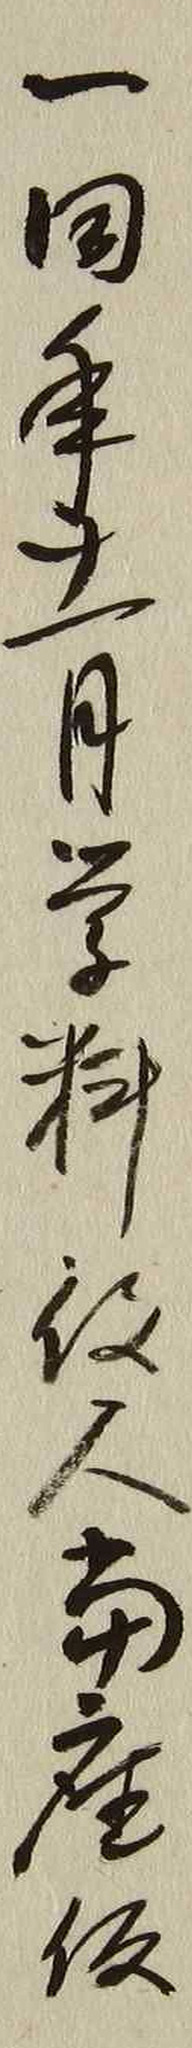一同年十一月学料役人当座仮
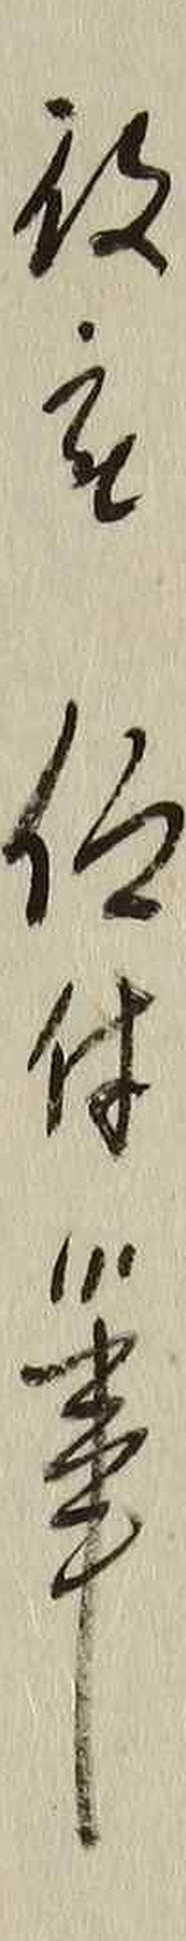役被仰付候事
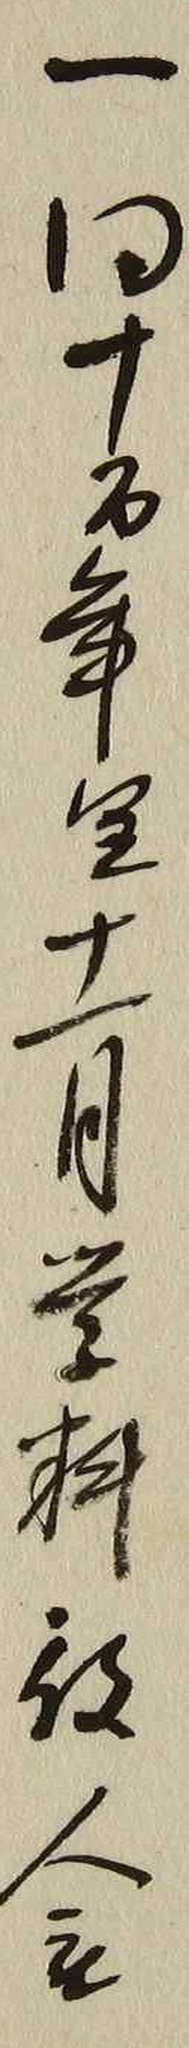一同十酉年閏十一月学料役人被
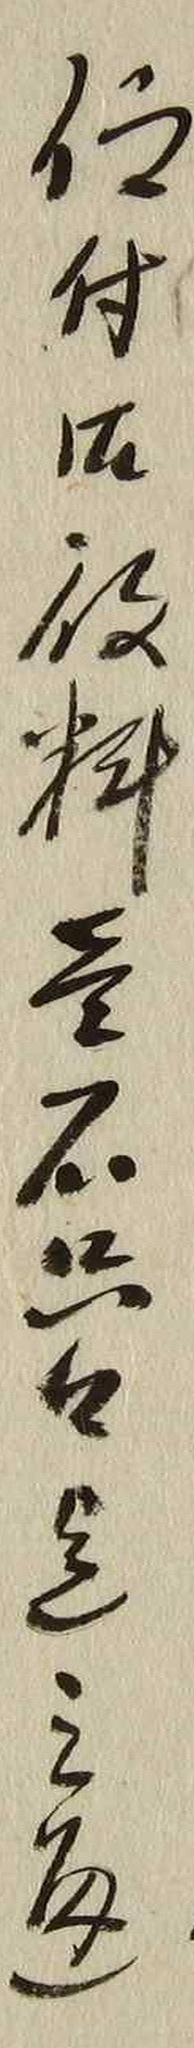仰付御役料壱石只今迄之通
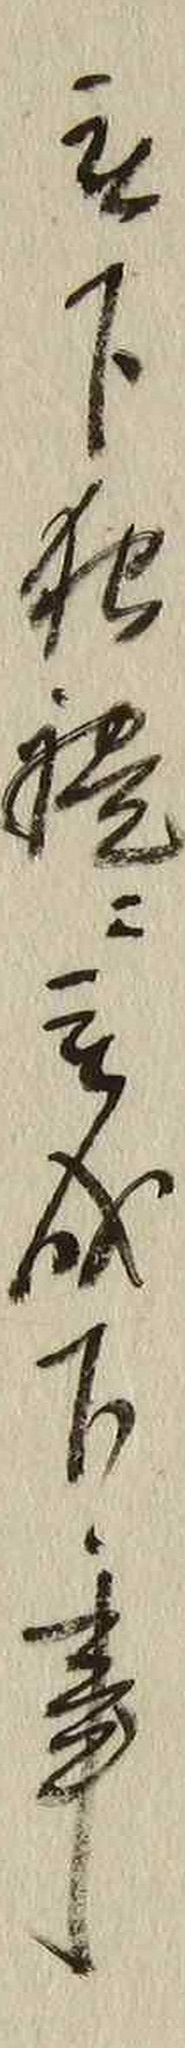被下独礼ニ被成下候事
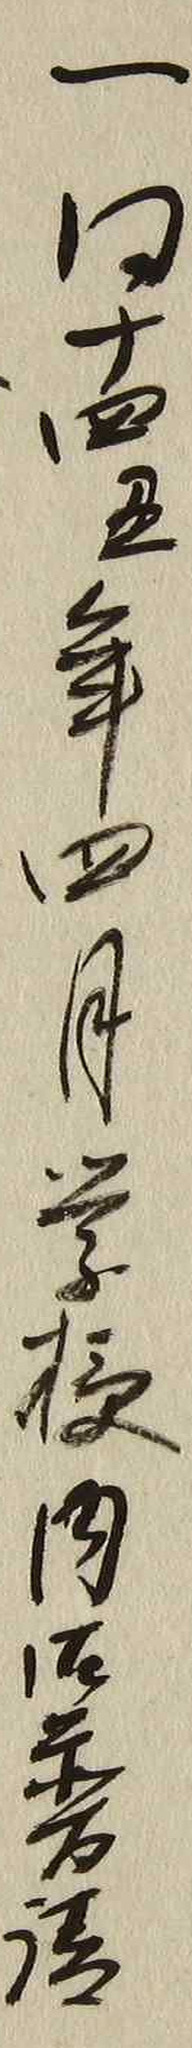一同十四丑年四月学校内御普請
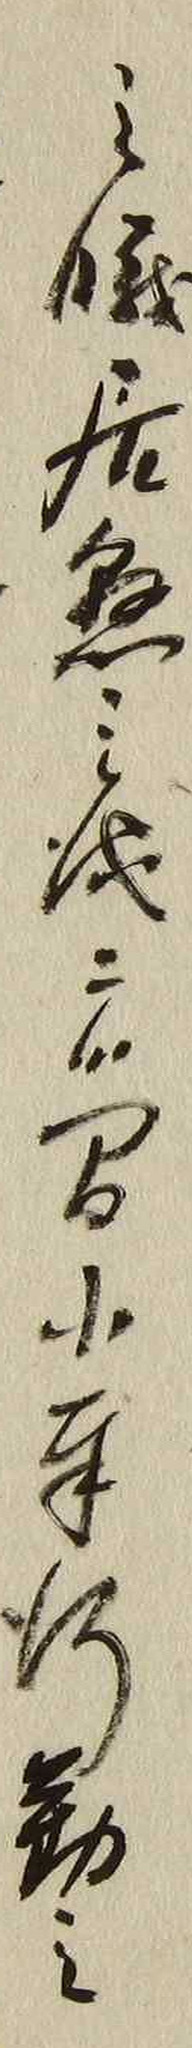之儀居懸之儀ニ候間小奉行勤之
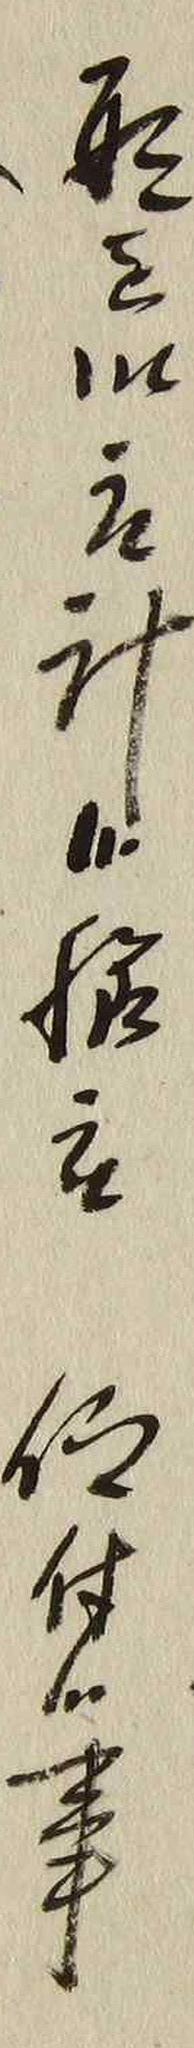形を以取計候様被仰付候事
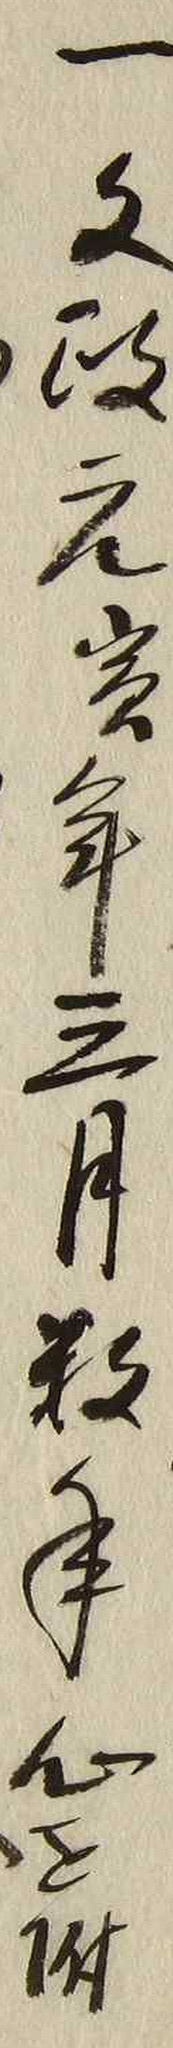一文政元寅年三月数年心を附
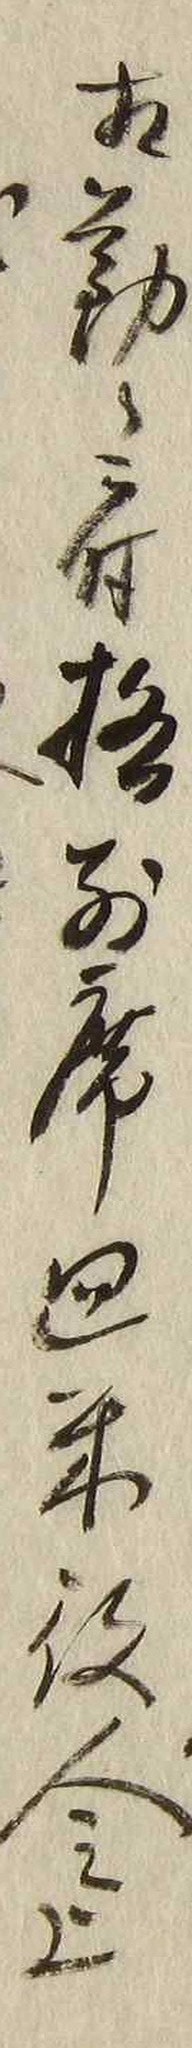相勤候ニ付格別席廻米役人之上
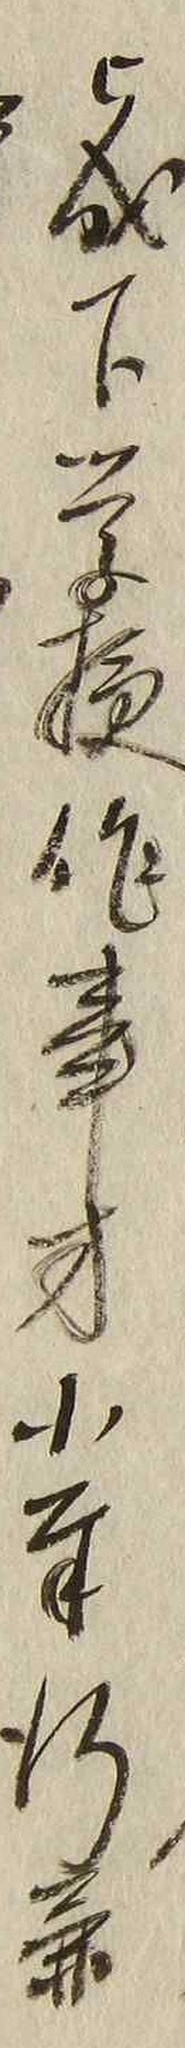被成下学校作事方小奉行兼
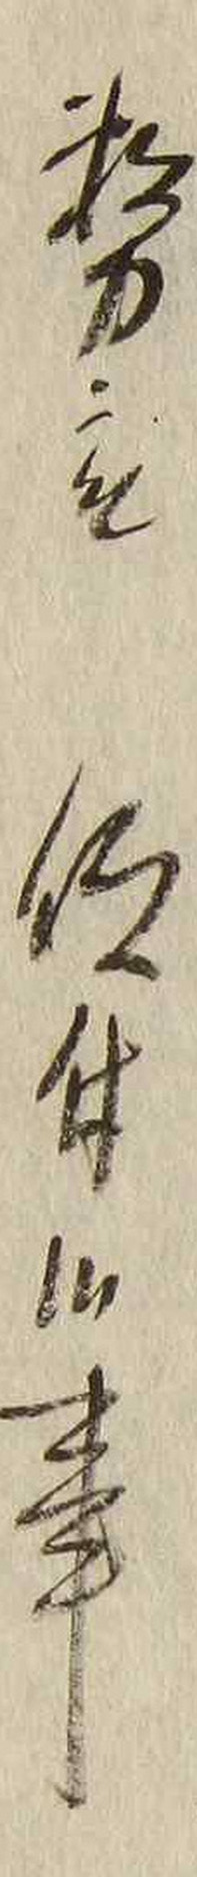務被仰付候事

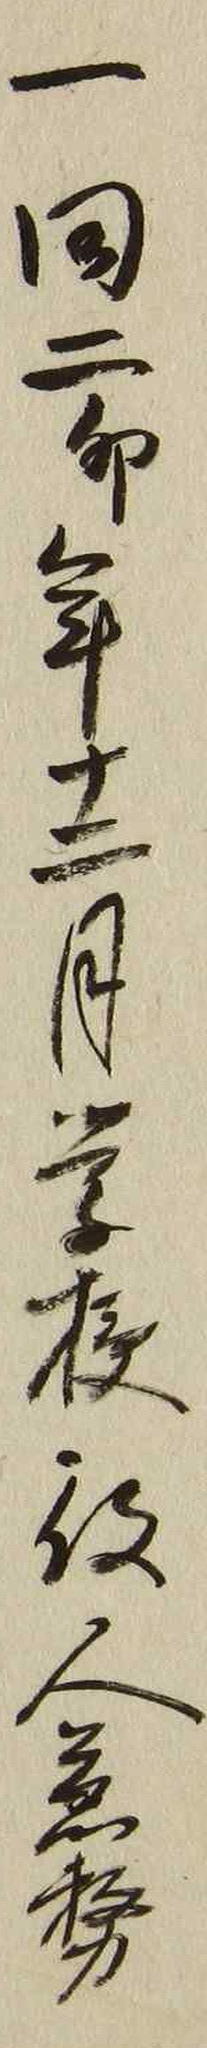一同二卯年十二月学校役人兼務
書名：諸士系譜　巻之353　す之部3
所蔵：会津若松市立会津図書館
